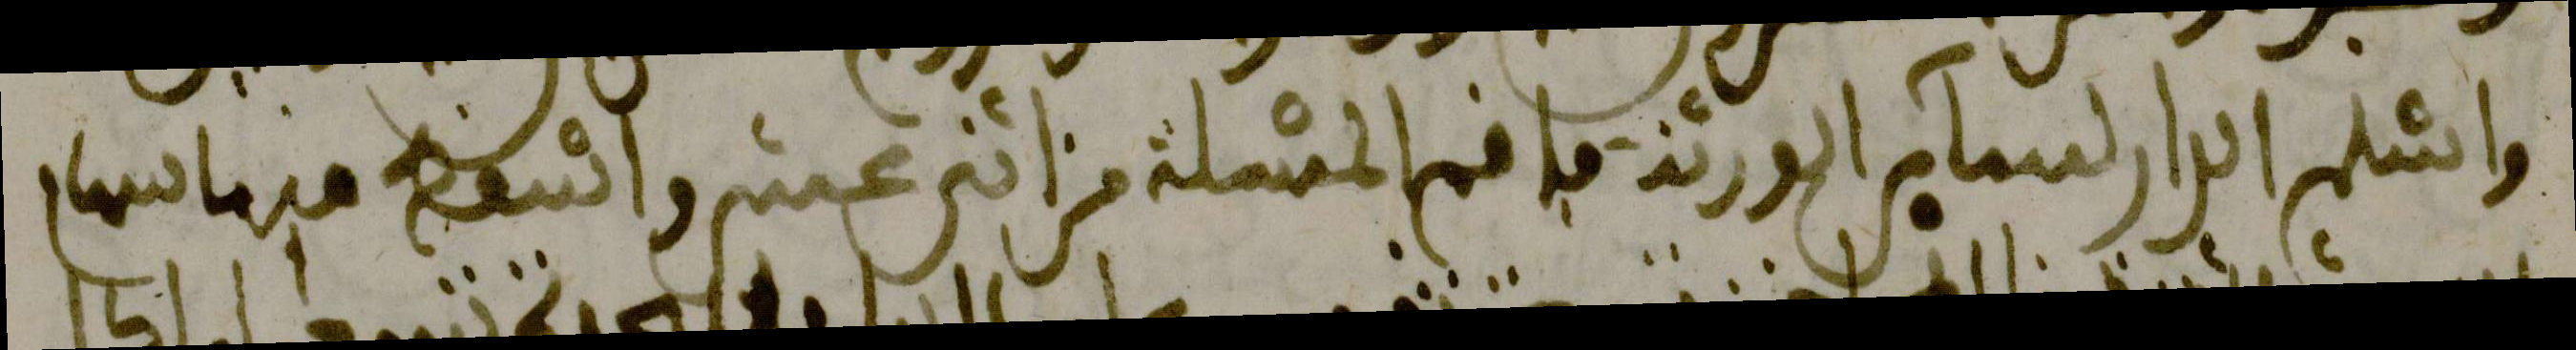واسْلم الدار لسائر الورثة فاقم المسْلة من اثنى عشر واسْقط منها سهام
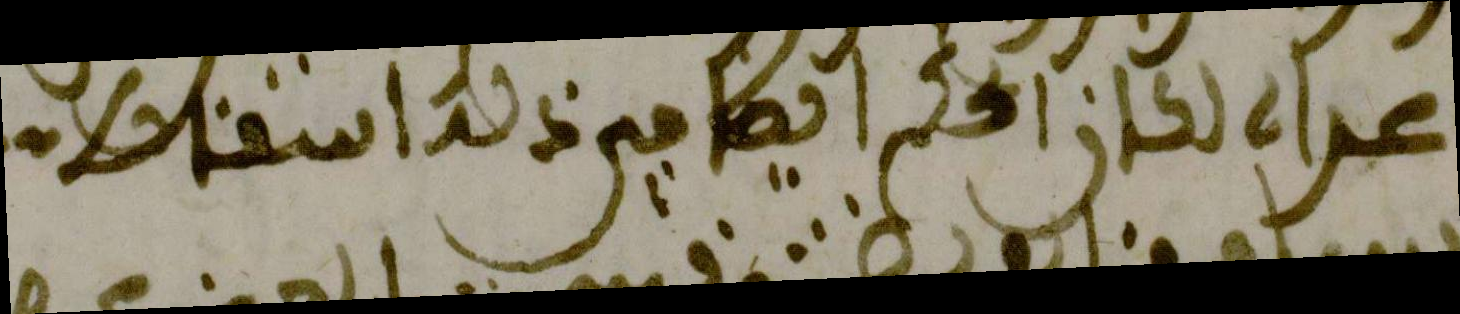عداء لكان الحكم ايضا في ذلك اسقاط
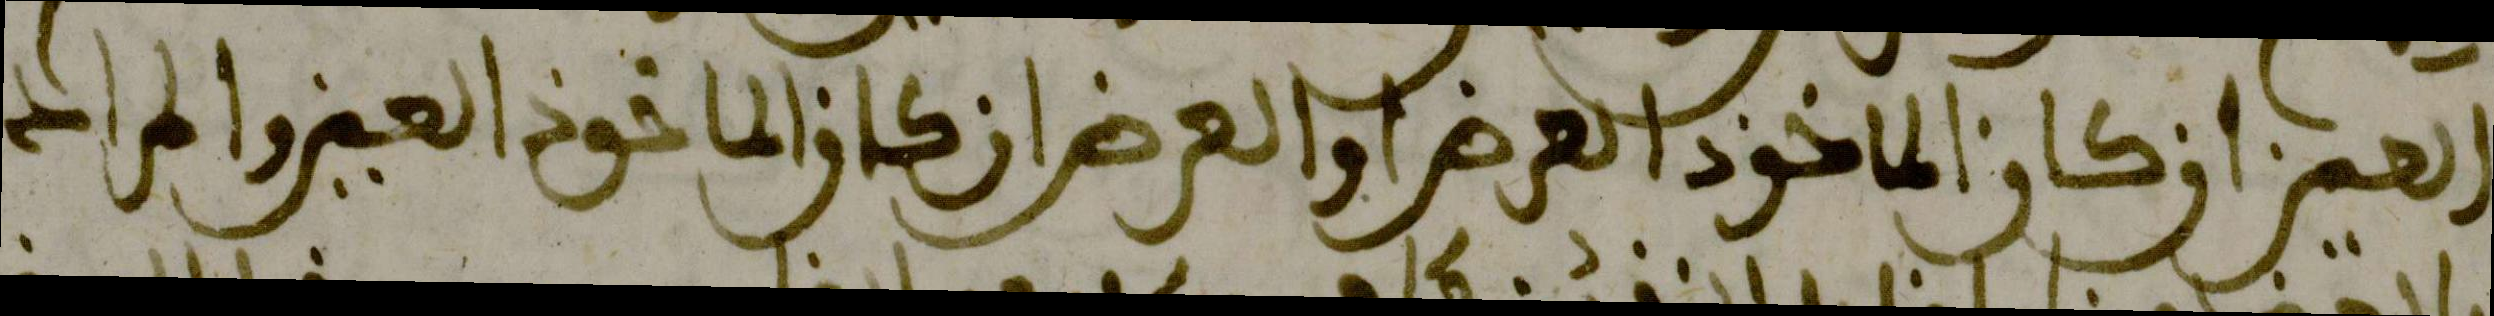العين ان كان الماخوذ العرض والعرض ان كان الماخوذ العين والمراد
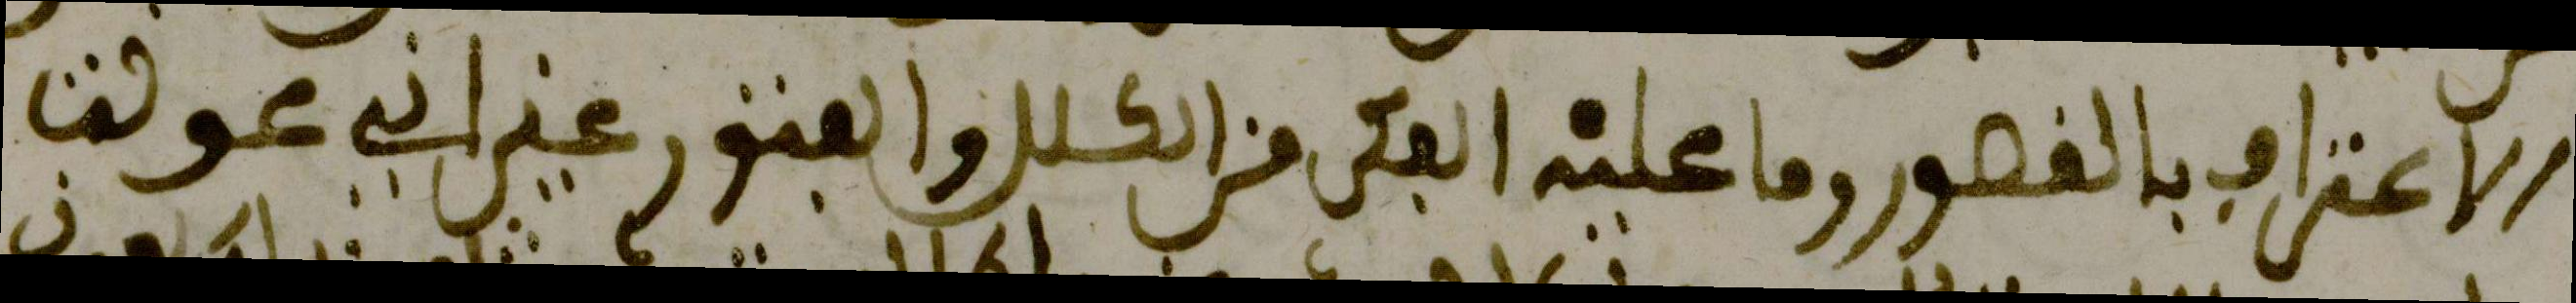الاعتراف بالقصور وما عليْه الفكر من الكلل والفتور غير اني عولت
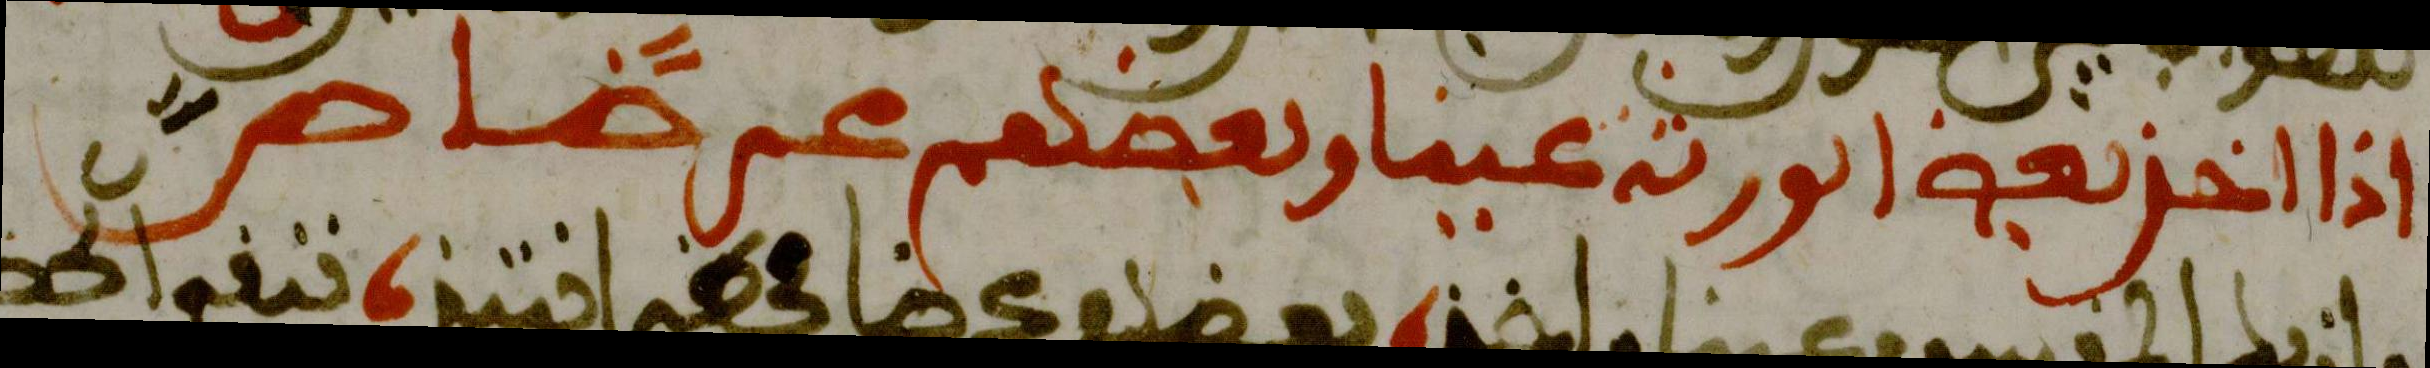اذا اخذ بعض الورثة عينا وبعضهم عرضًا ص
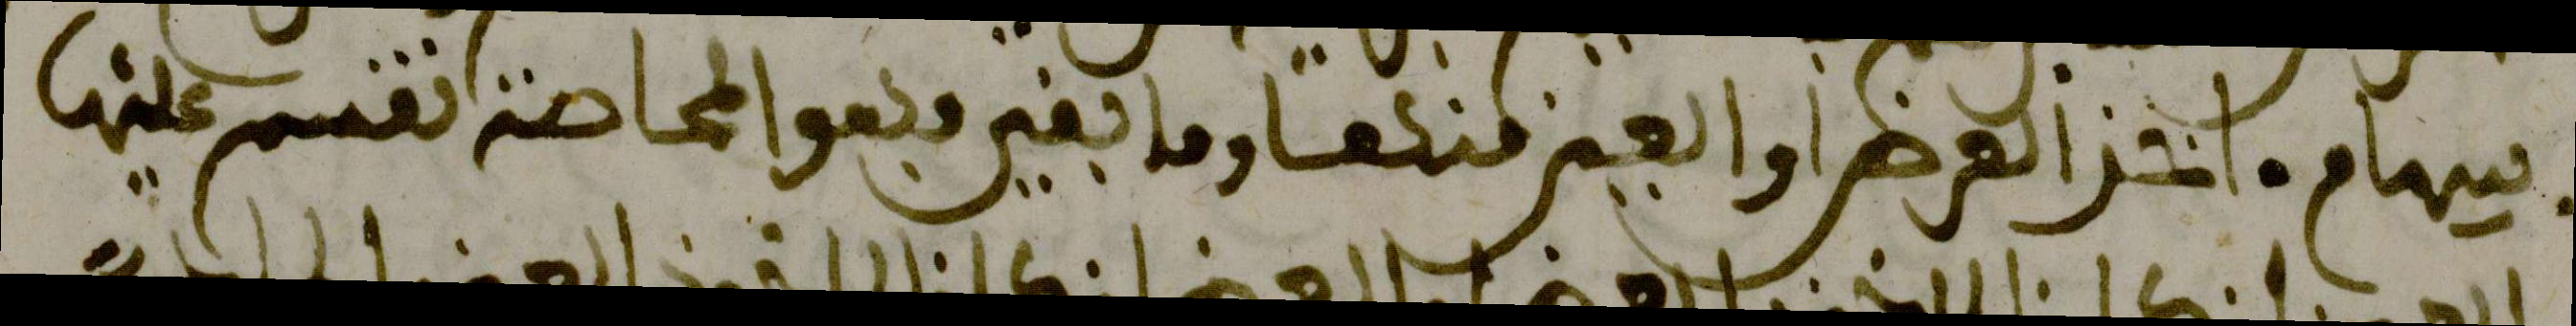سِهام اخذ العرض او العين منها وما بقي فهو المحاصة تقسم عليْها
